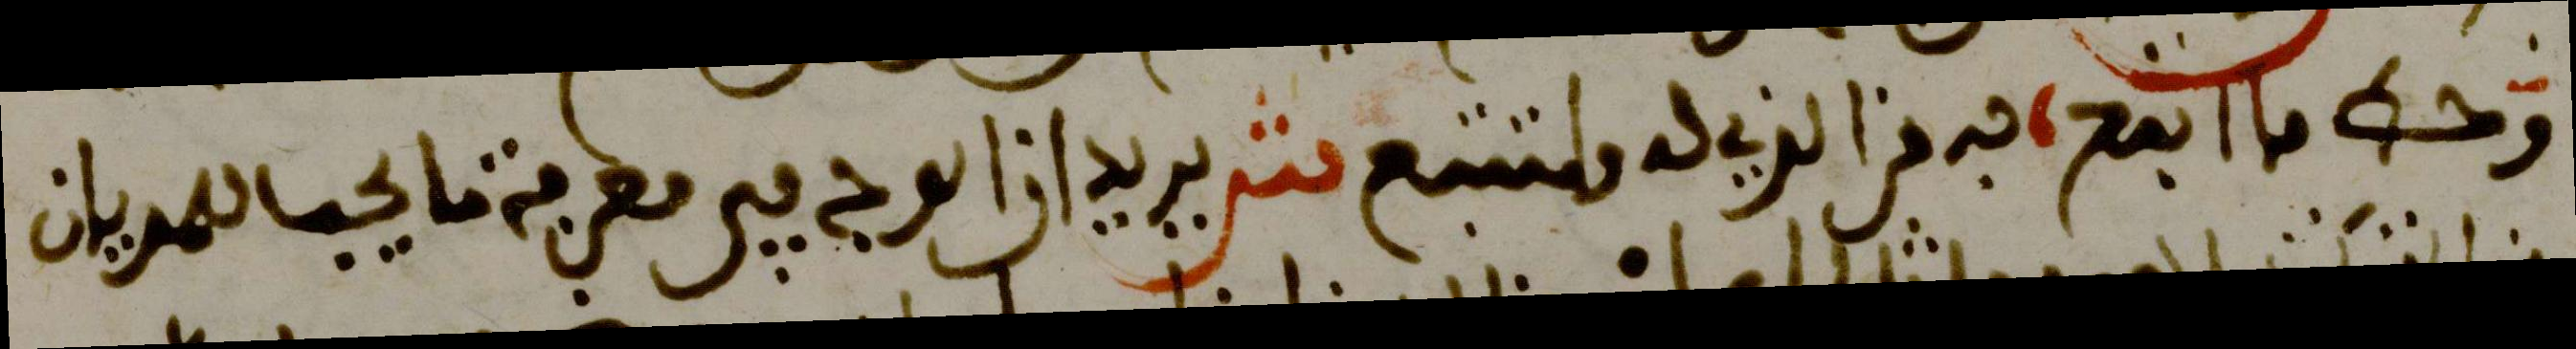وَحط ما تبع به من الذي له ولتتبع ش يريد ان الوجه في معرفة ما يجب للمديان
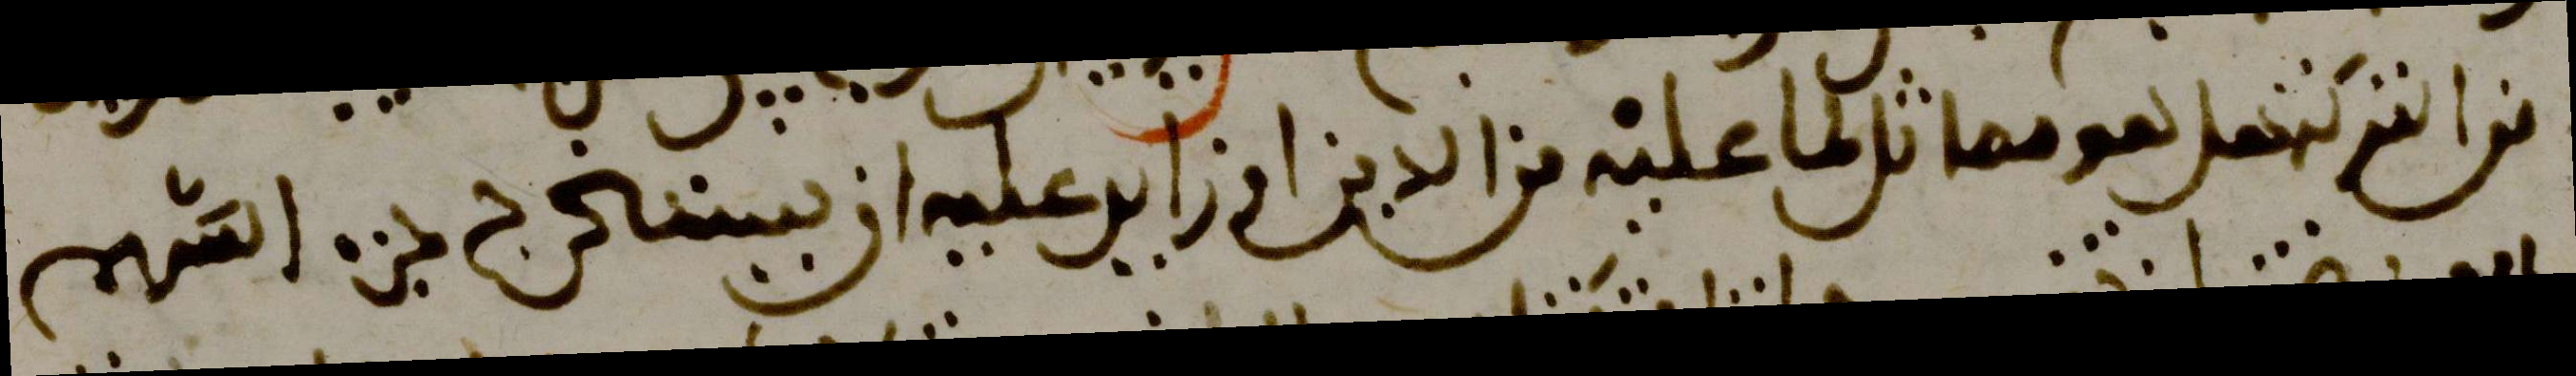من التركة هل هو مماثل لما عليْه من الدين او زايد عليه ان يستخرج جزء السَّهم
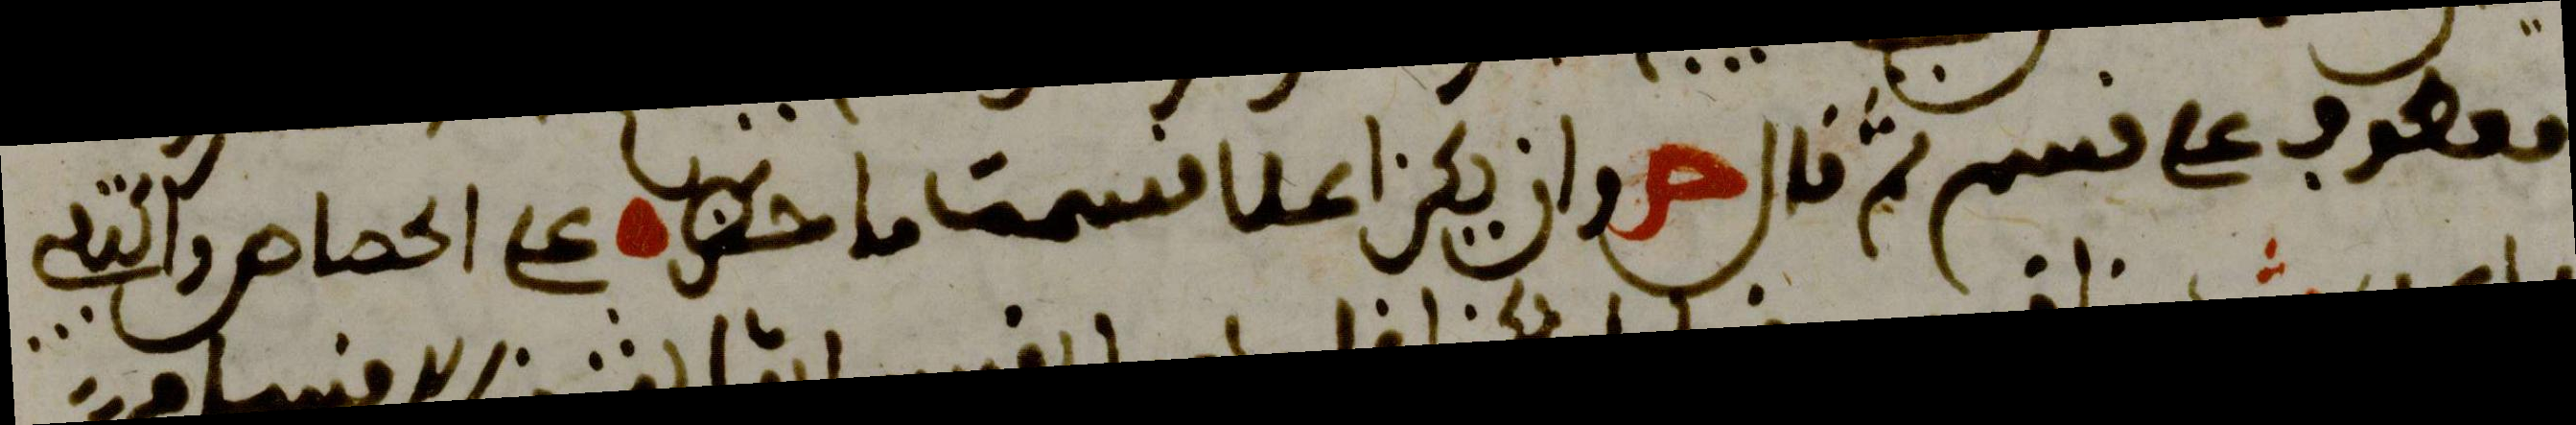معطوف على قسم ثم قال ص وان يكن اعلا قسمت ما حضر على الحصاص واكتفي
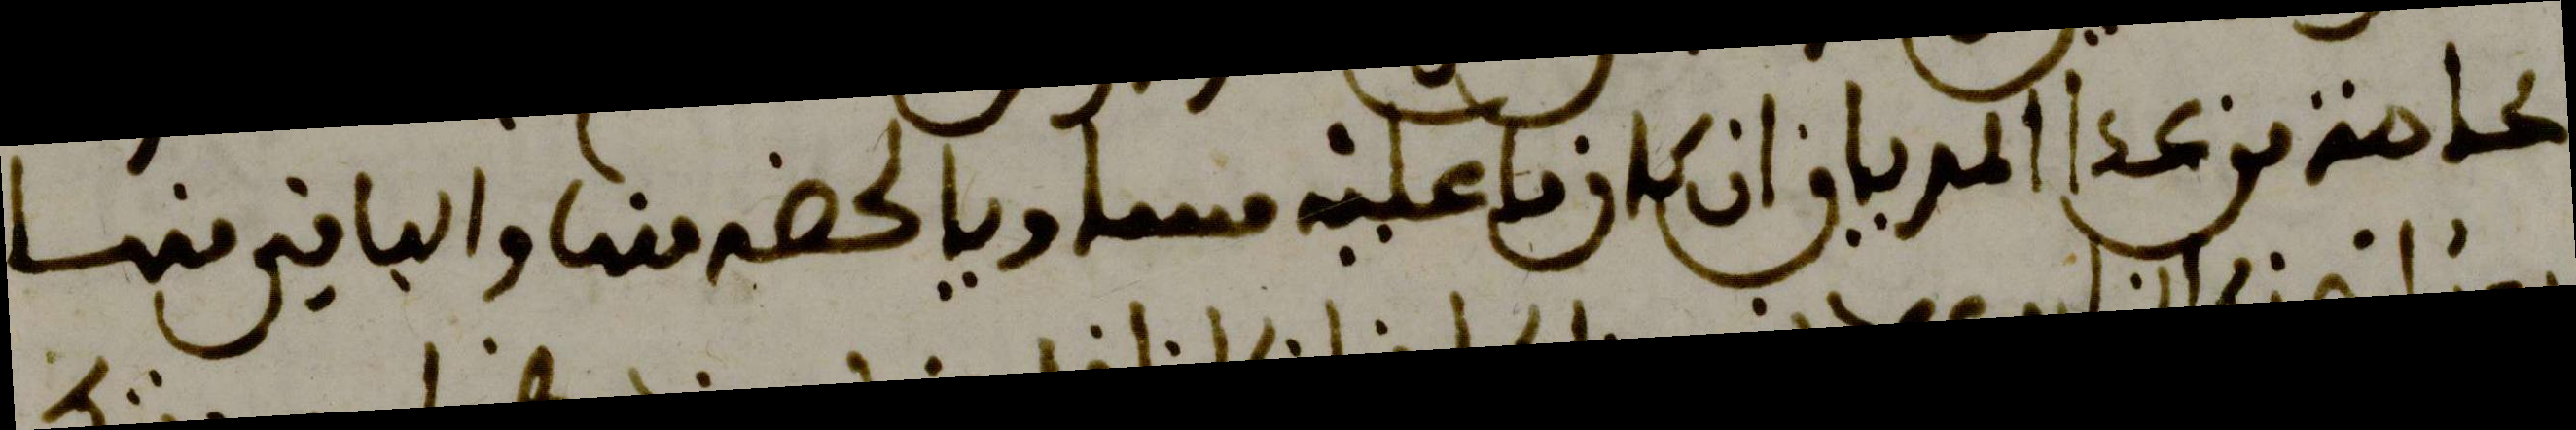محاصة من عدا المديان ان كان ما عليْه مساويا لحضه منها والباقي منها
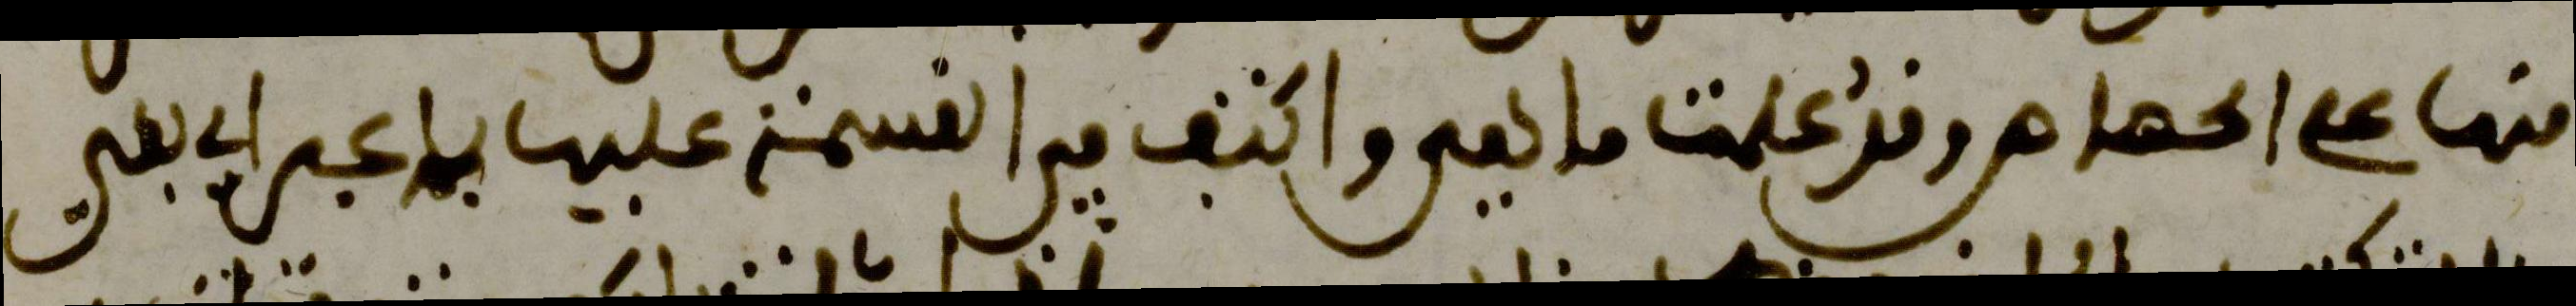منها على الحصاص وقد علمت ما هي واكتف في القسمة عليها بما عبر اي بقي
